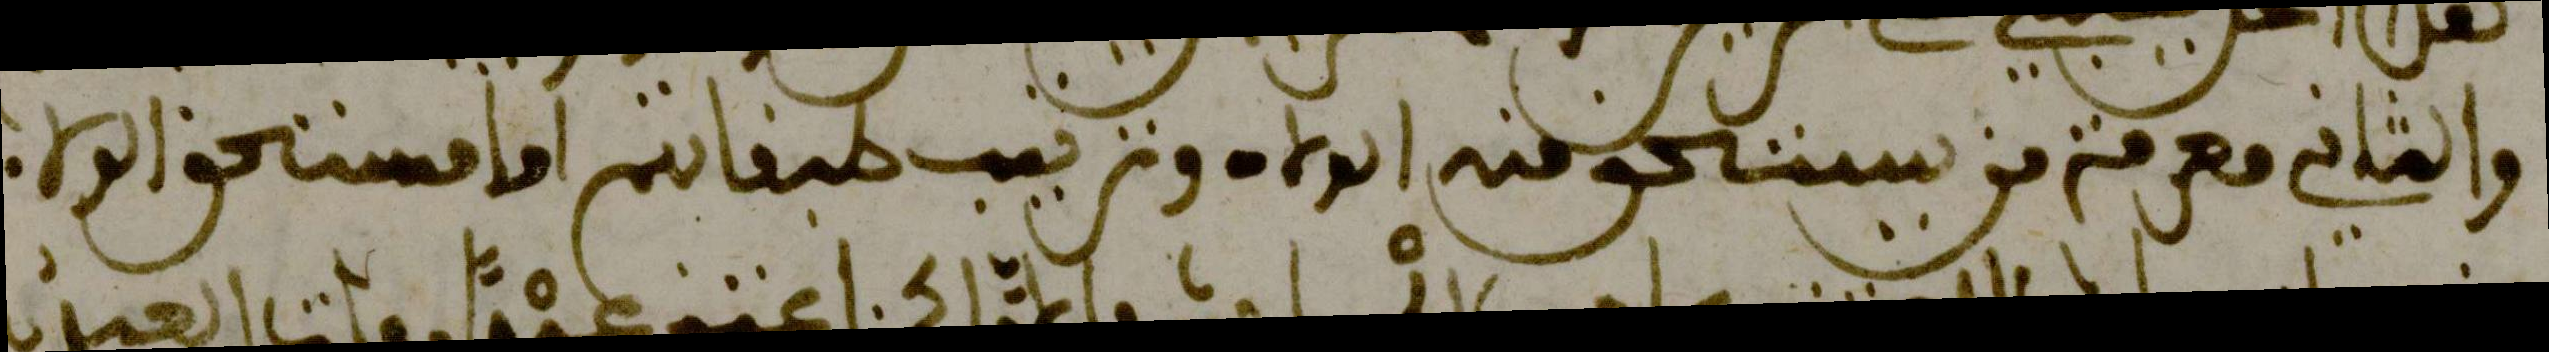والثاني معرفة من يستحق منه الولاء وترتيب طبقاتهم اما مستحق الولاء
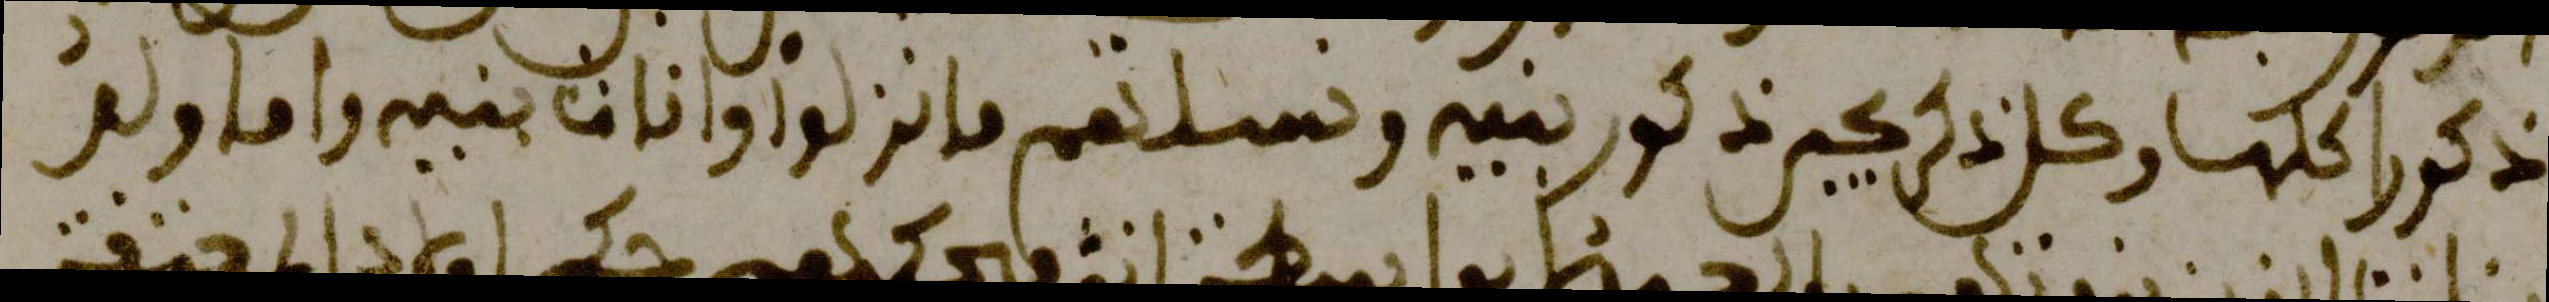ذكورا كلها وكل ذكر يحجر ذكور بنيه ونسلهم ما نزلوا واناثا بنيه واما ولد
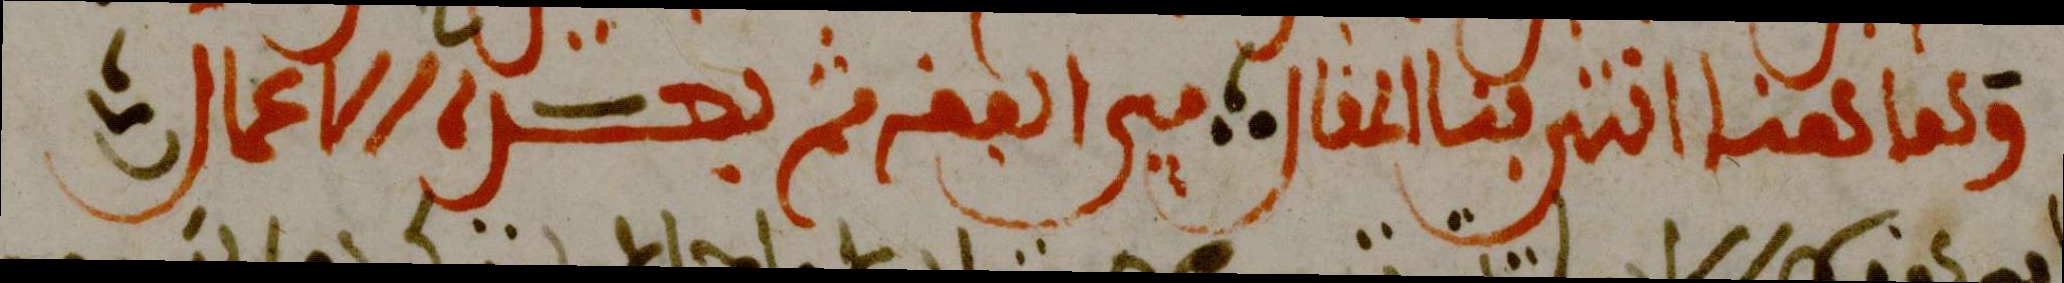وهاهنا انتهى بنا المقال في الفقه ثم بعده الاعمال
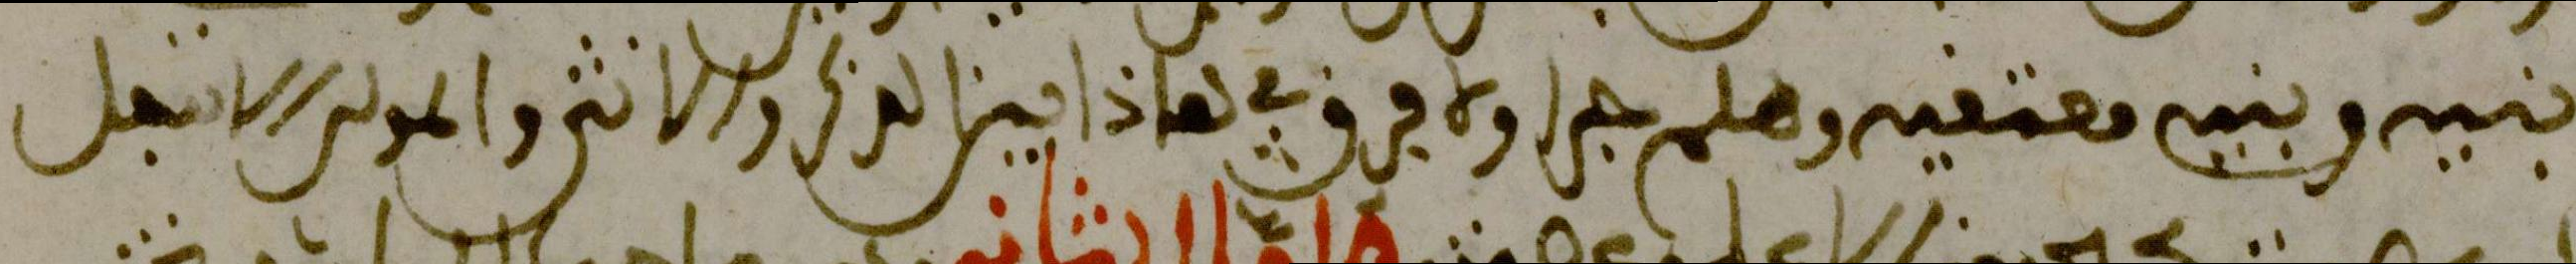بنيه وبني معتقيه وهلم جرا ولا فرق في هذا بين الذكر والاثنى والمولى الاسفل
